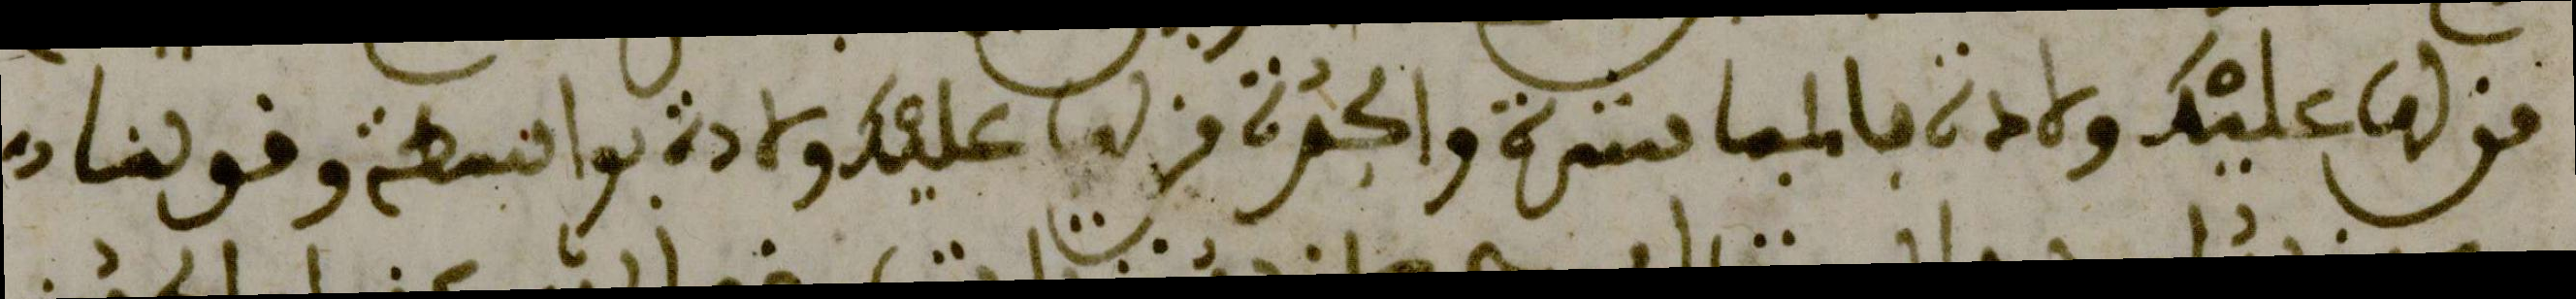من لها عليْك ولادة بالمباشرة والجدة من لها عليْك ولادة بواسطة وقولنا
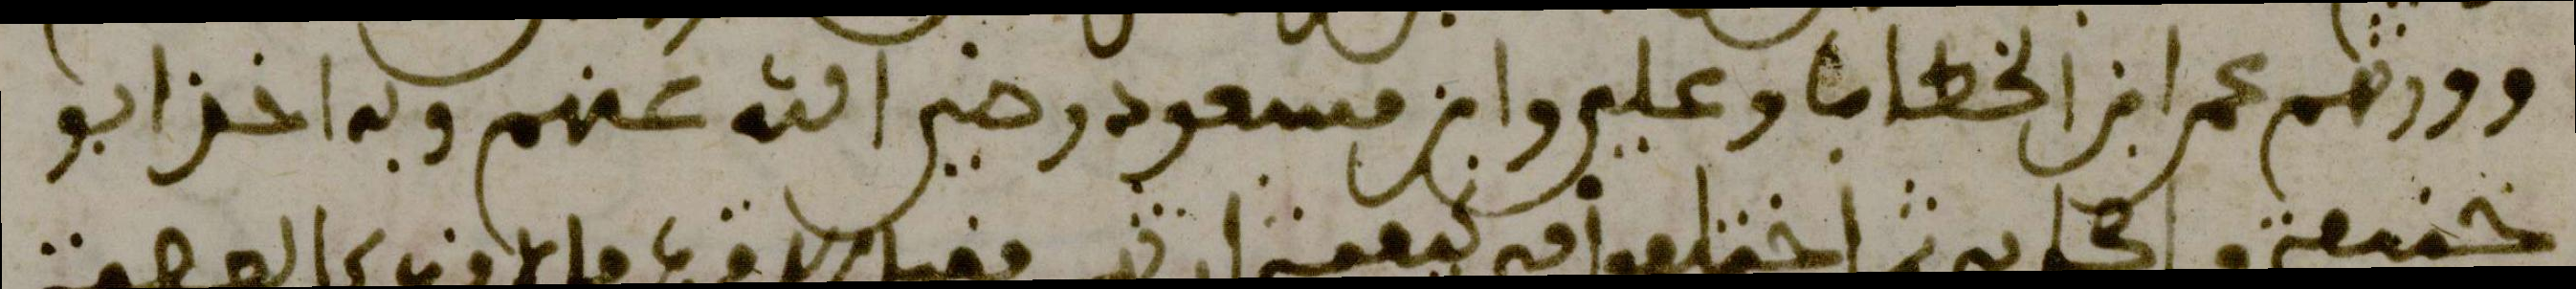وورثهم عمر ابن الخطاب وعلي وابن مسعود رضي الله عنهم وله اخذ ابو
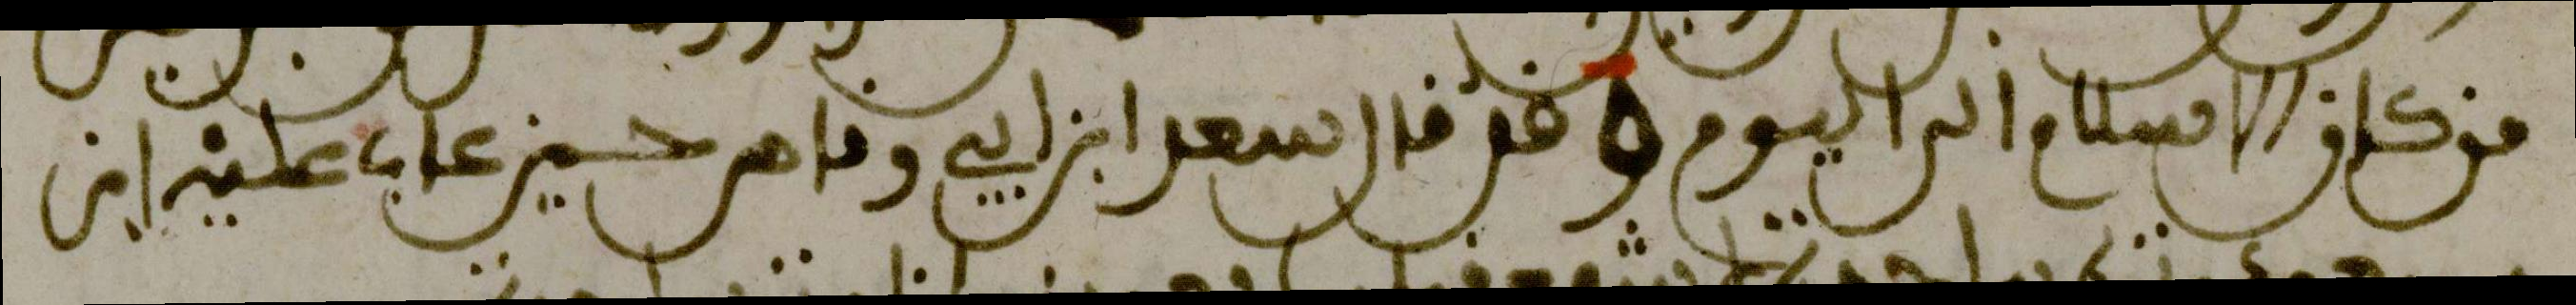من كان الاسلام الى اليوم وَقد قال سعد ابن ابي وقاص حين عاب عليْه ابن
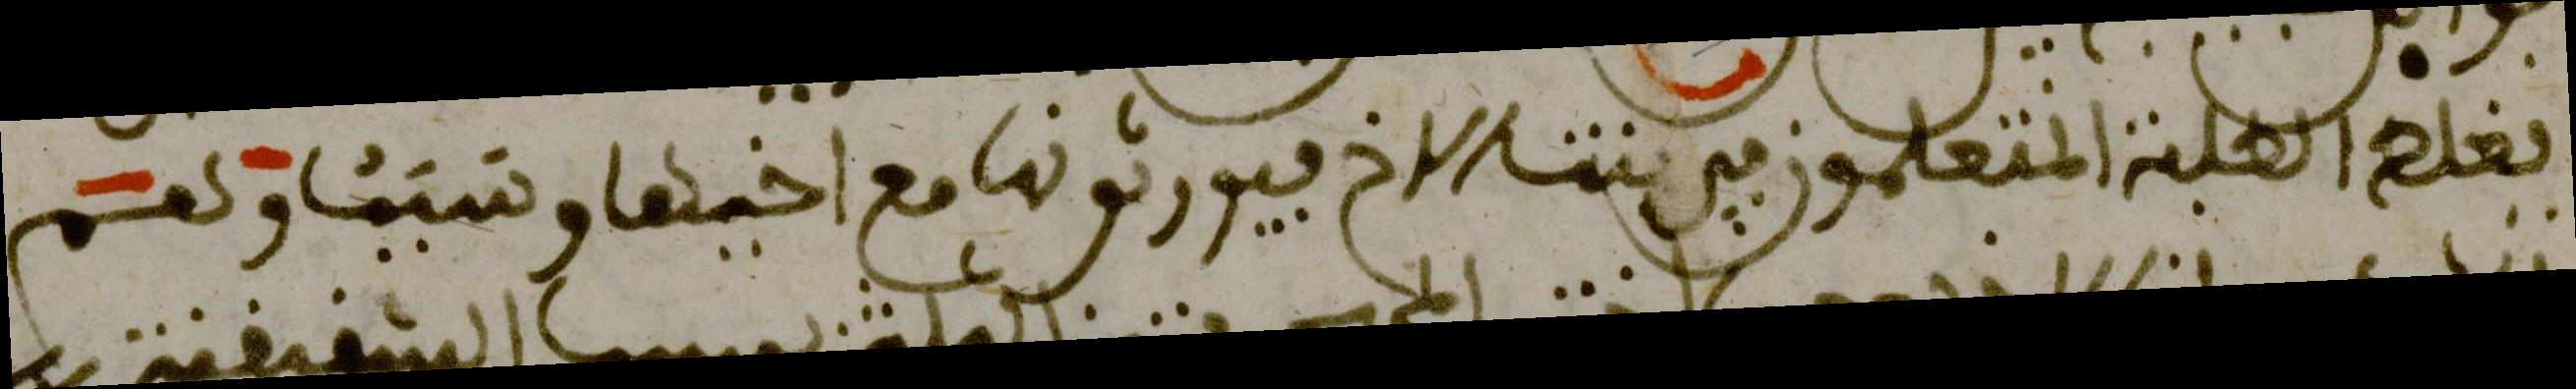يغلط الطلبة المتعلمون في بنت الاخ فيورثونها مع اخيها وسَبَبُ وَهم
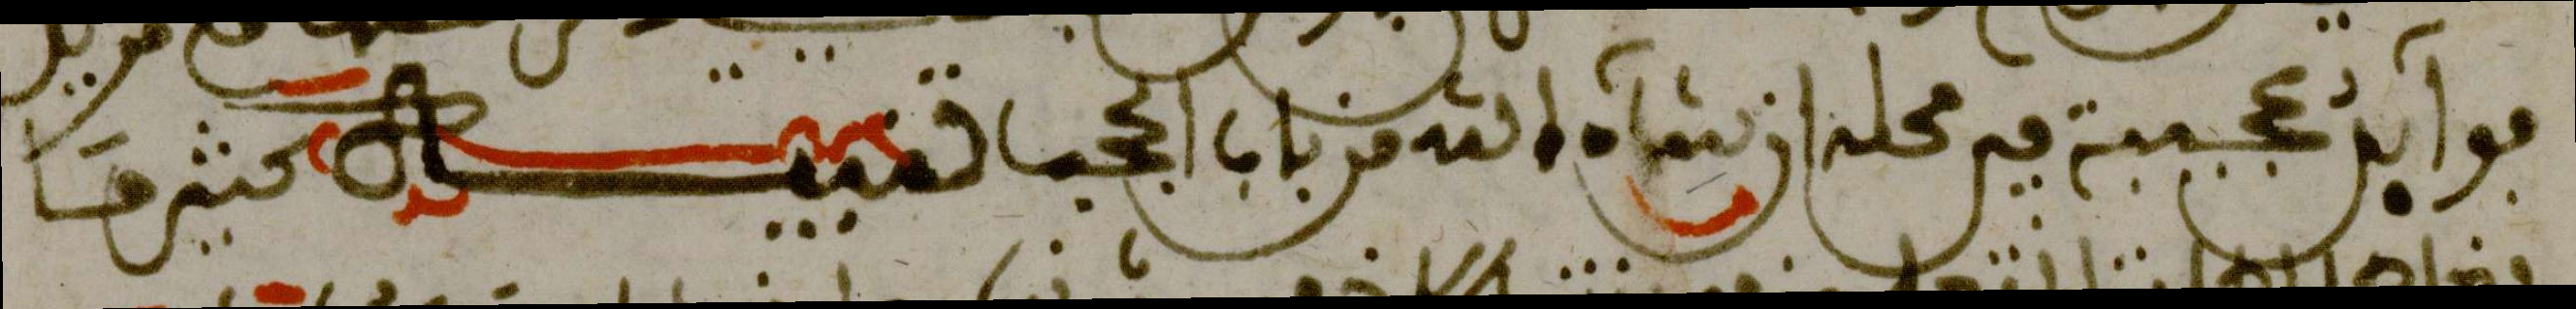فوائد عجيبة في محله ان شاء الله من باب الحجب تنبيه كثير ما
